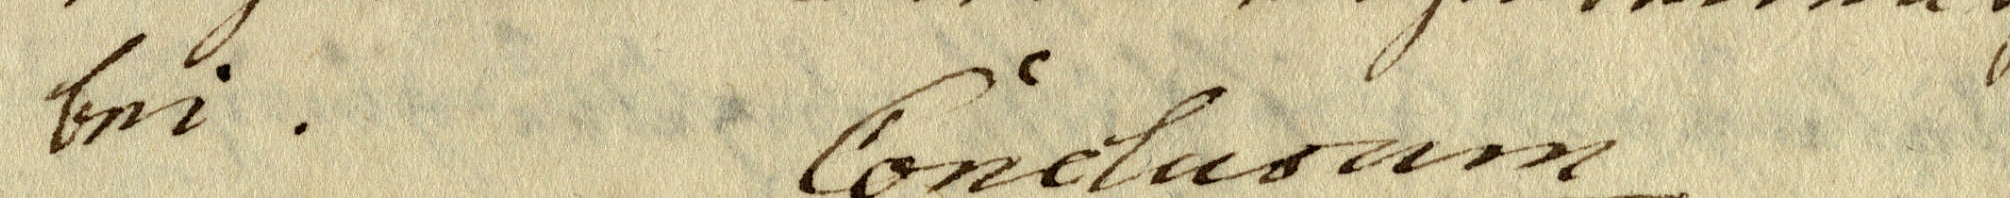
bei.
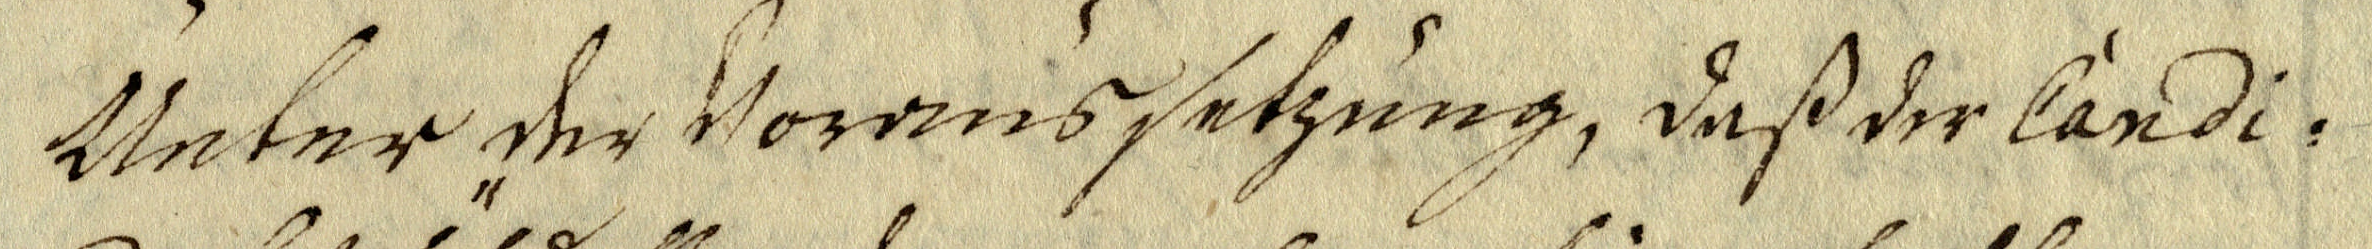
Unter der Voraussetzung, daß der Candi¬
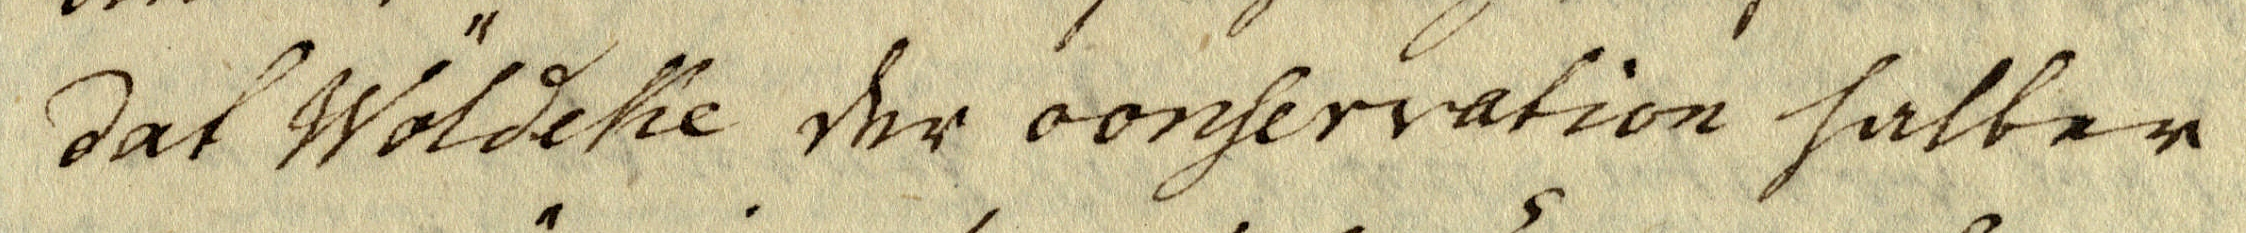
dat Wöldeke der conservation halber
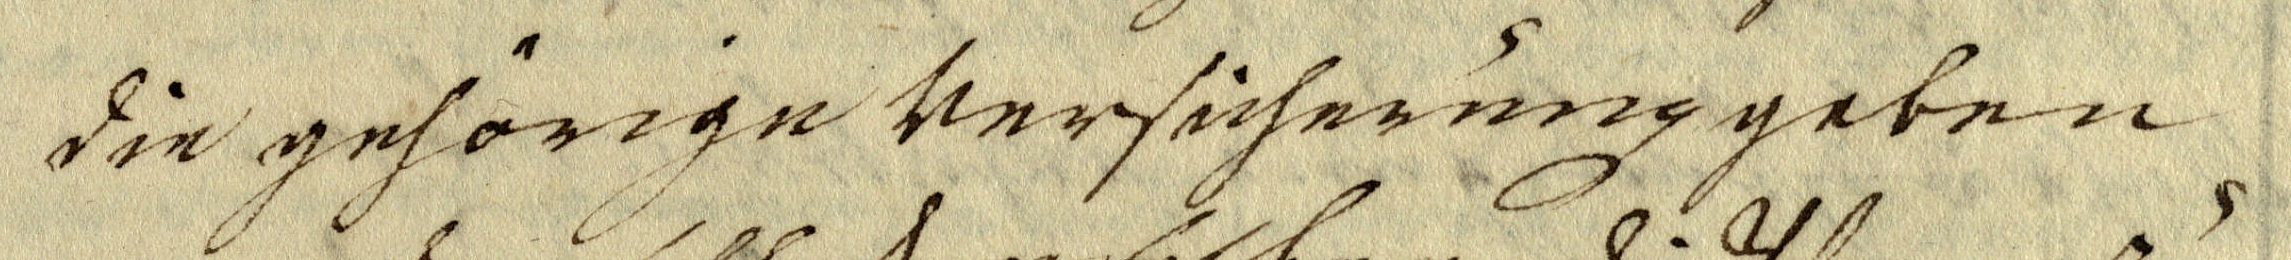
die gehörige Versicherung geben
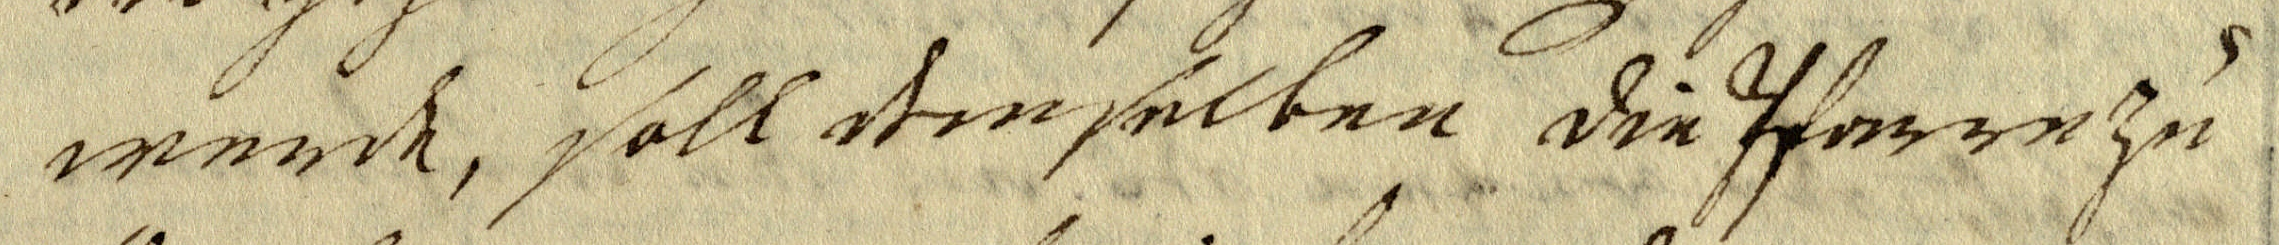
werde, soll demselben die Pfarre zu
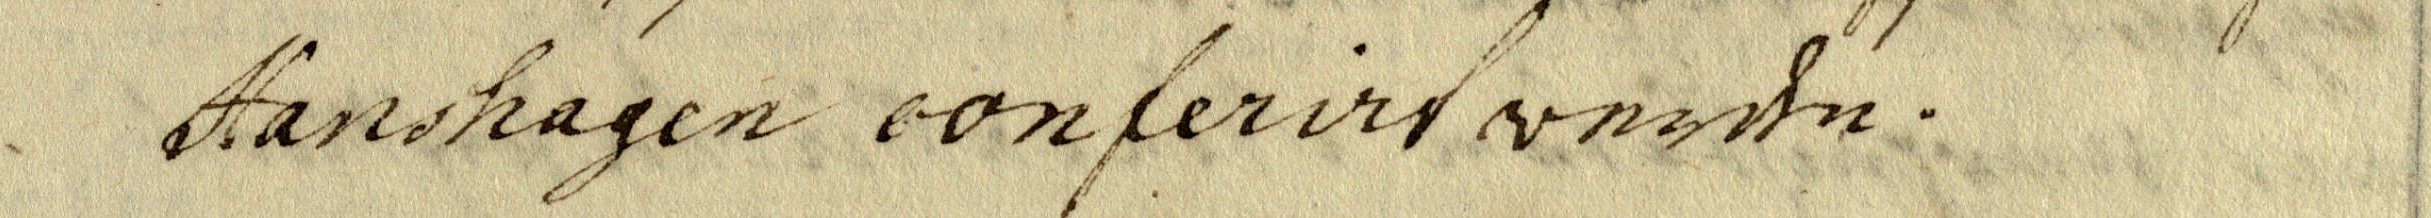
Hanshagen conferirt werden.
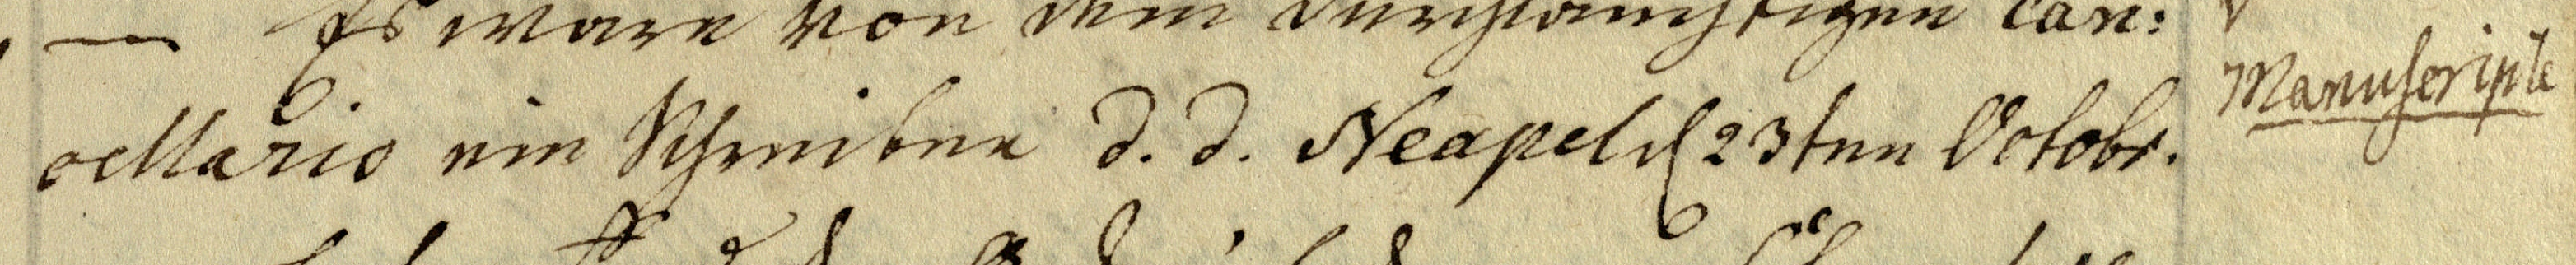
cellario ein Schreiben d.d. Neapel d. 23ten Octobr: Manuscripte
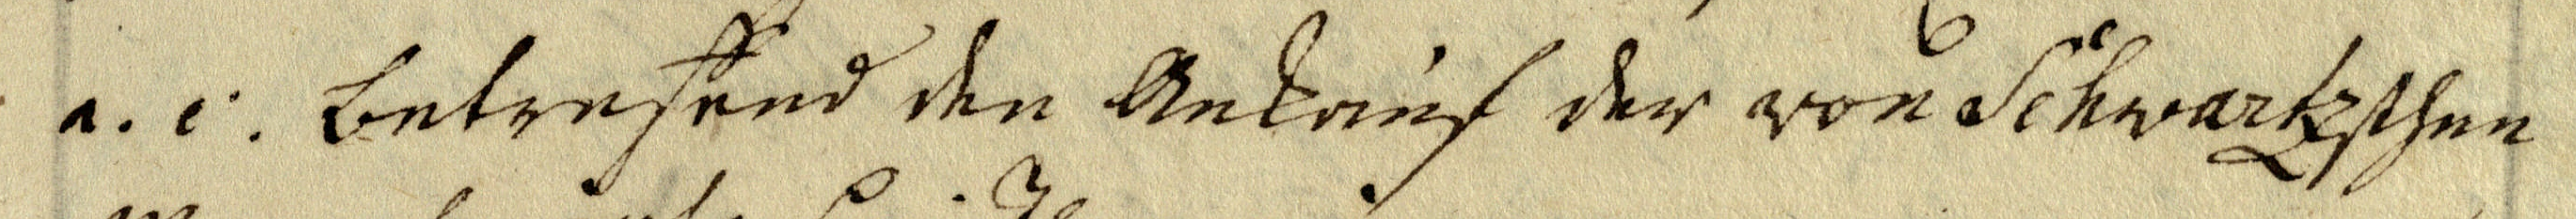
a. c. Betreffend den Ankauf der von Schwartzschen
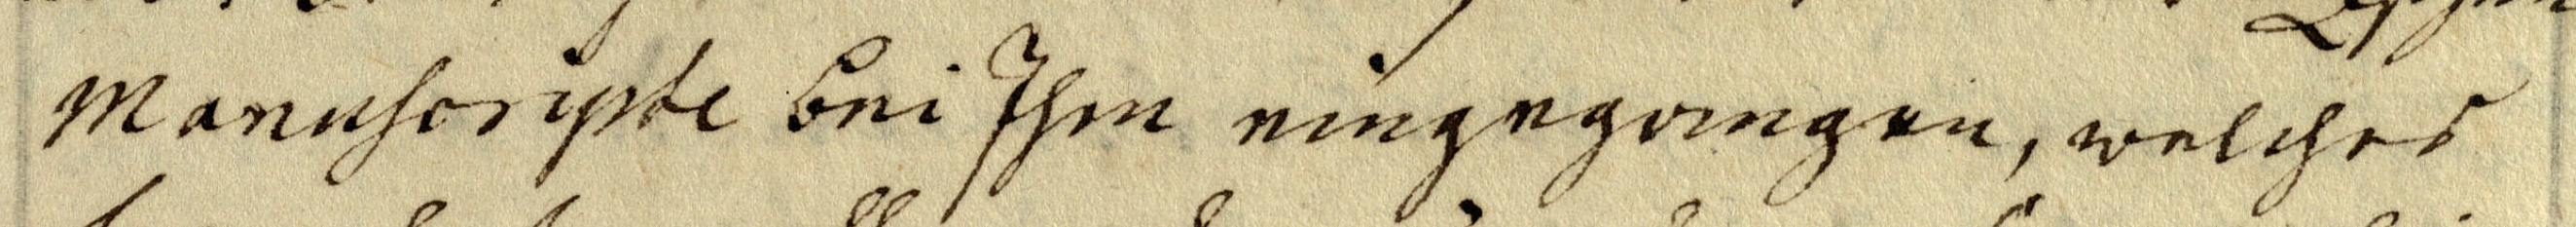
Manuscripte bei Ihm eingegangen, welches
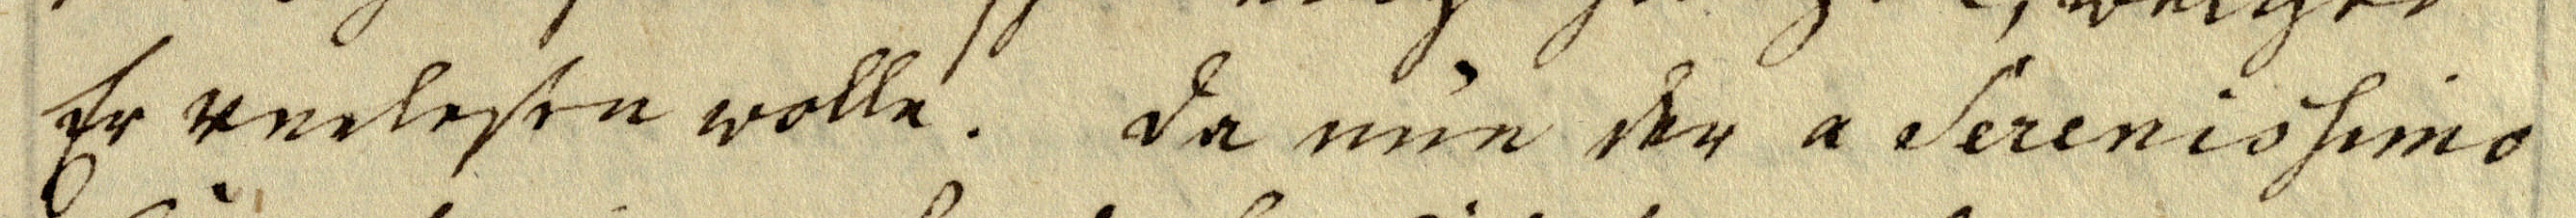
Er verlesen wolle. Da nun der a Serenissimo
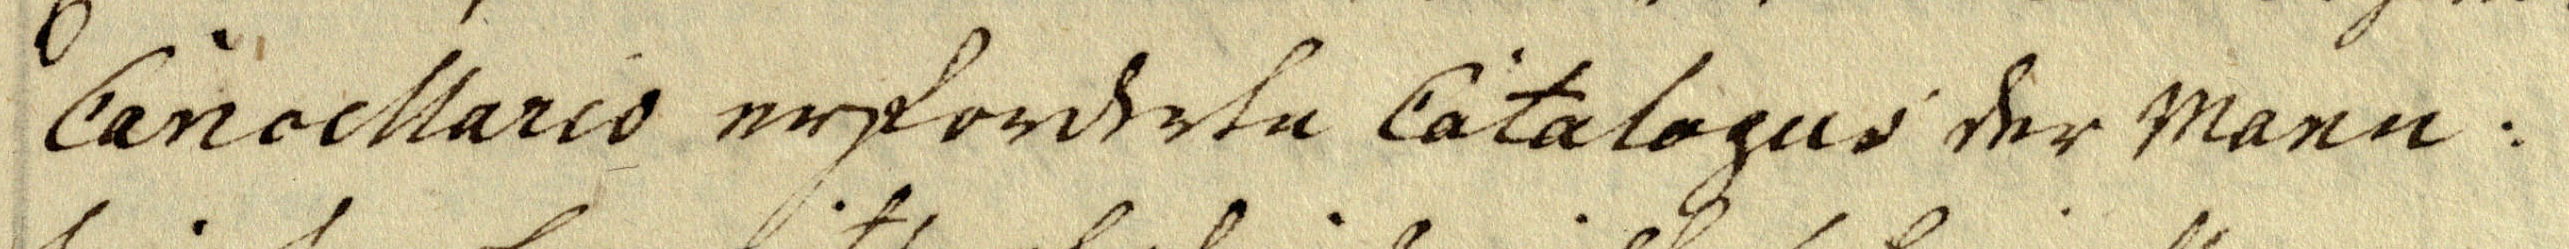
Cancellario erforderte Catalogus der Manu¬
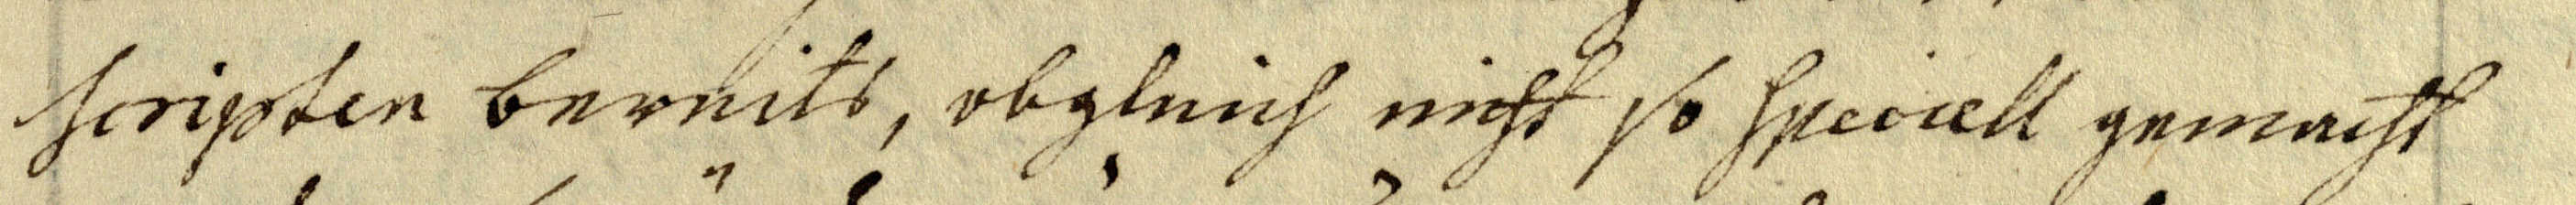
scripten bereits, obgleich nicht so speciell gemacht
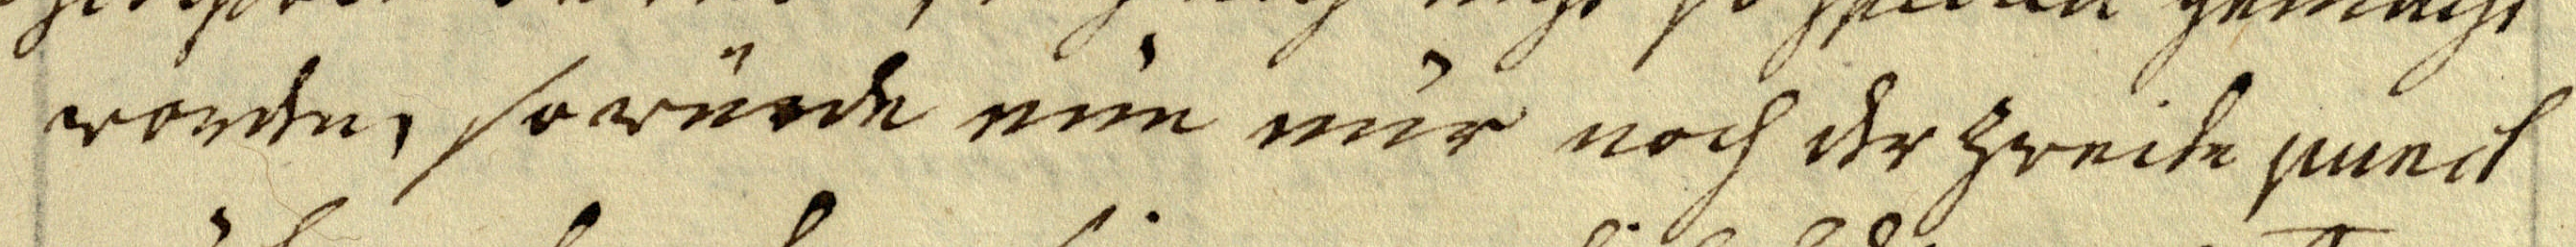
worden, so würde nun nur noch der zweite punct
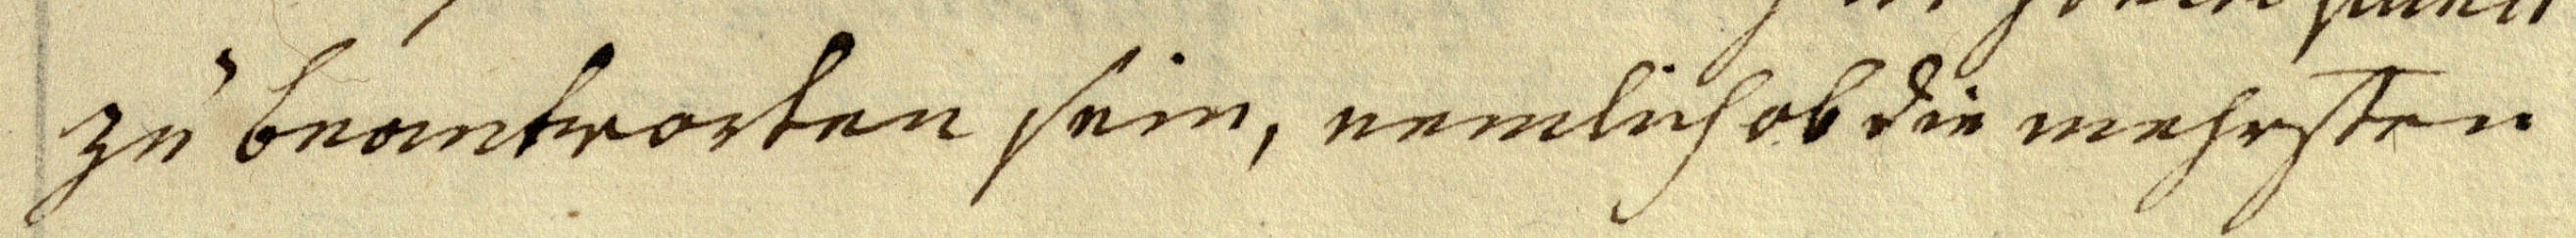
zu beantworten sein, nemlich ob die mehrsten
